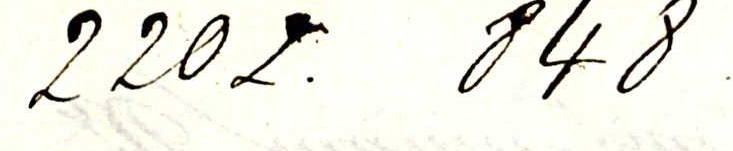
2202 848
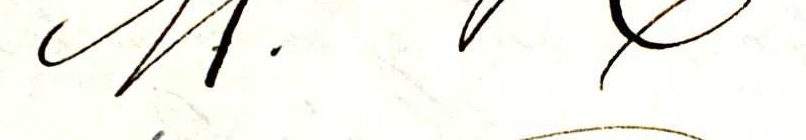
MR
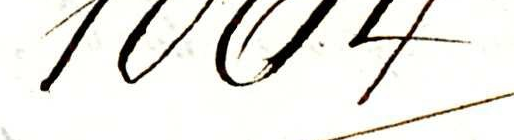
1064
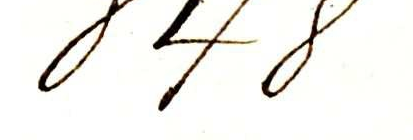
848
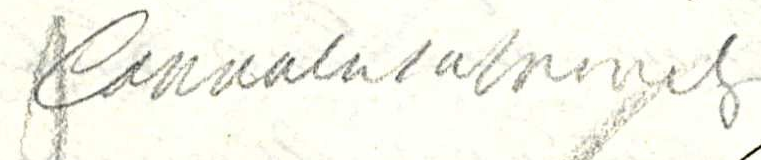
Convalutasrench
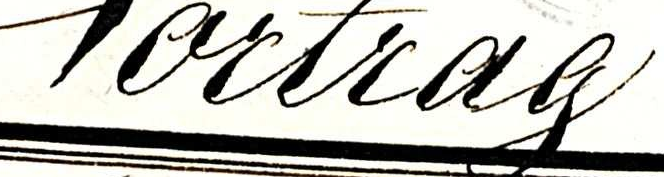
Vortrag
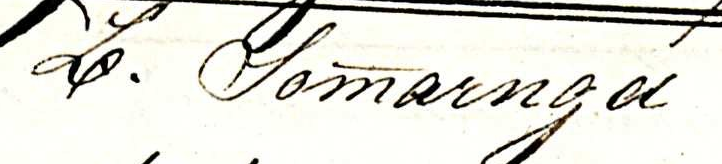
B. Sommaruga
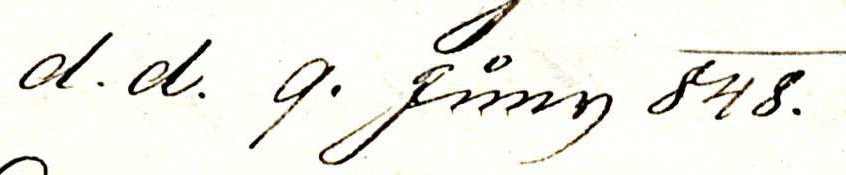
d.d. 9. Juny [1]848
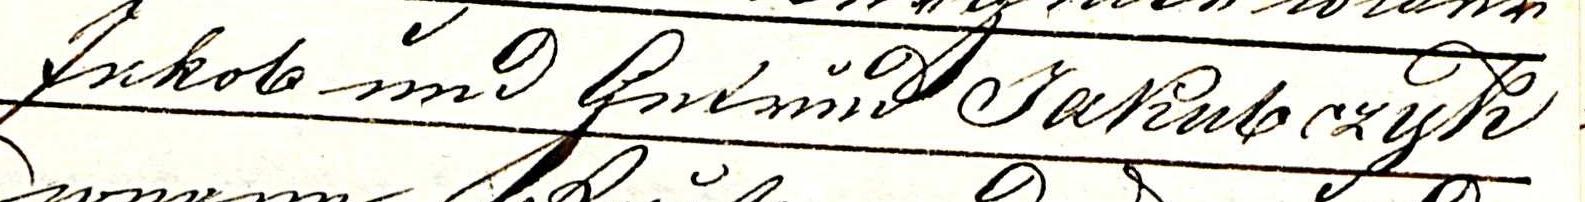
Jakob und Gertrud Jakubczyk:
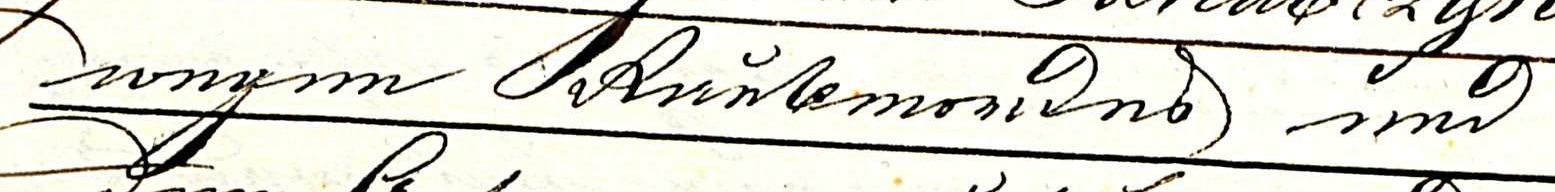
wegen Raubmordes und
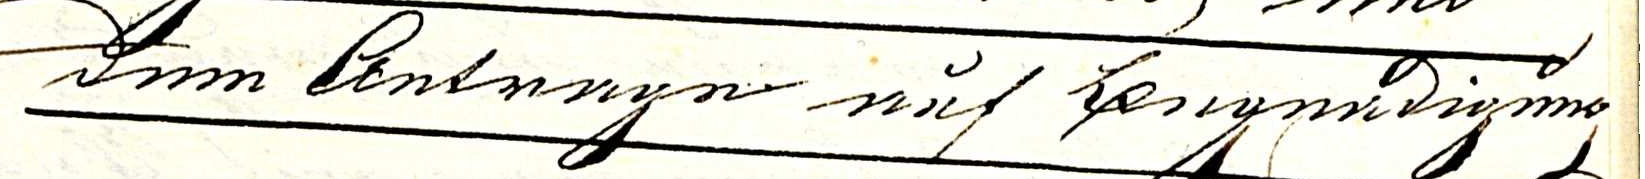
dem Antrage auf Begnadigung
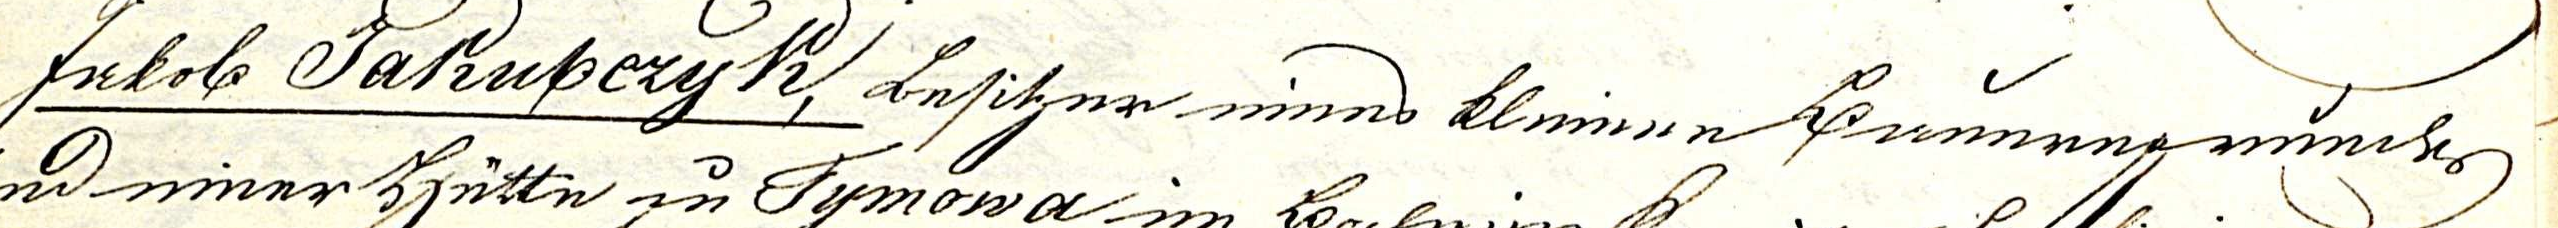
Jakob Jakubczyk, Besitzer eines kleinen Bauerngrundes
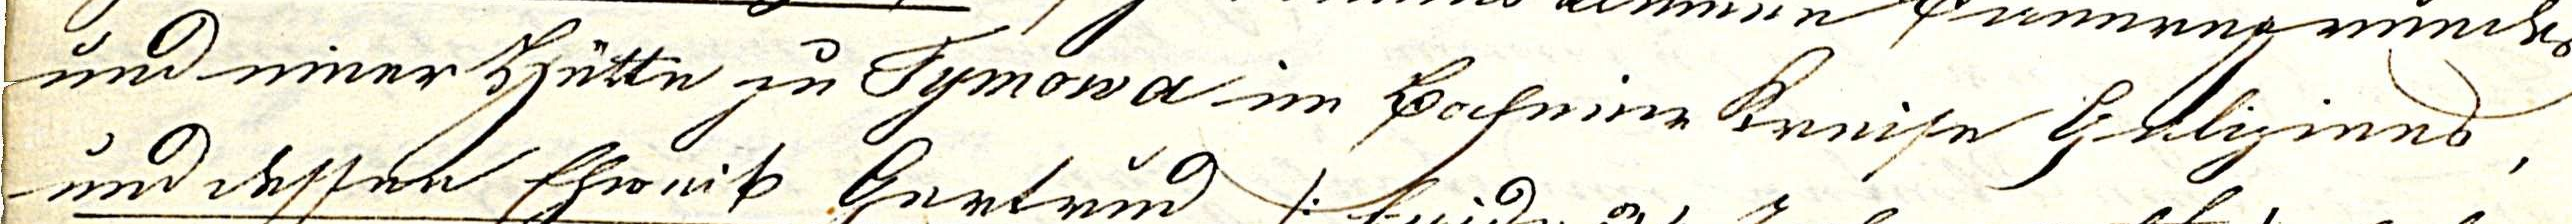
und einer Hütte zu Tymowa im Bochnier Kreise Galiziens,
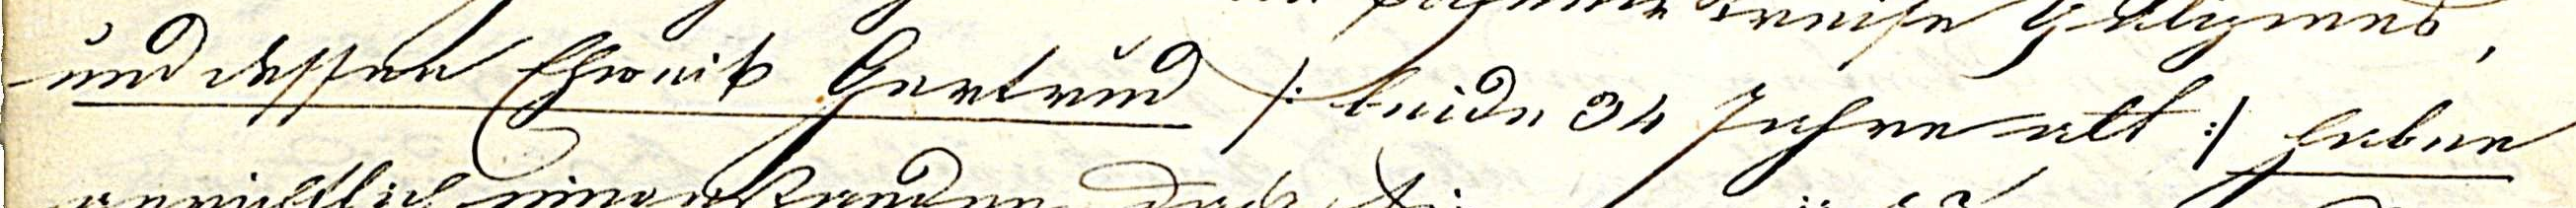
und dessen Eheweib Gertrud (beide 34 Jahre alt) haben
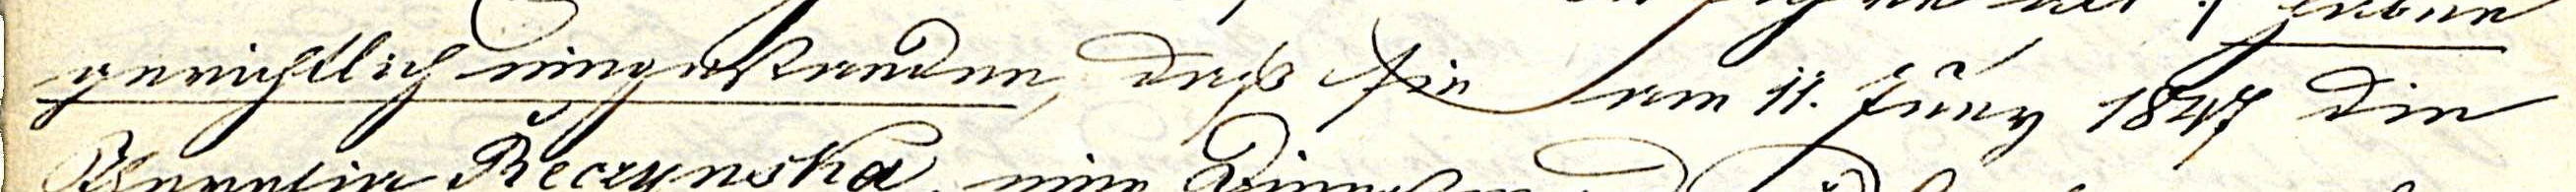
gerichtlich eingestanden, daß sie am 11. Juny 1847 die
